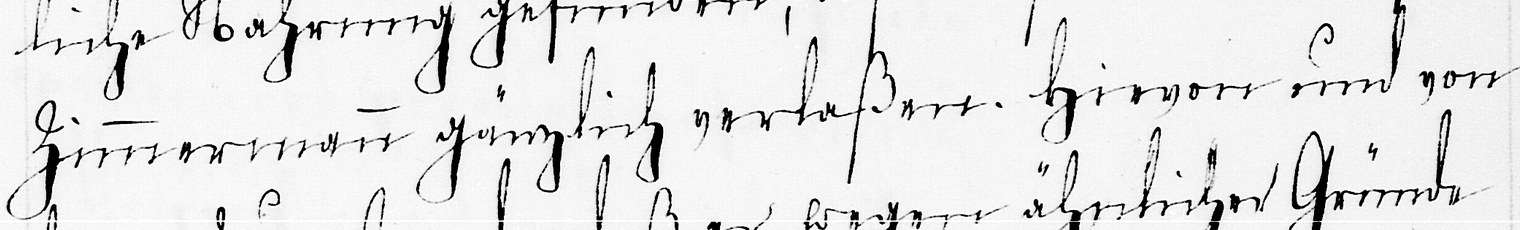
Zimmermann gänzlich verlaßen. Hievon und von
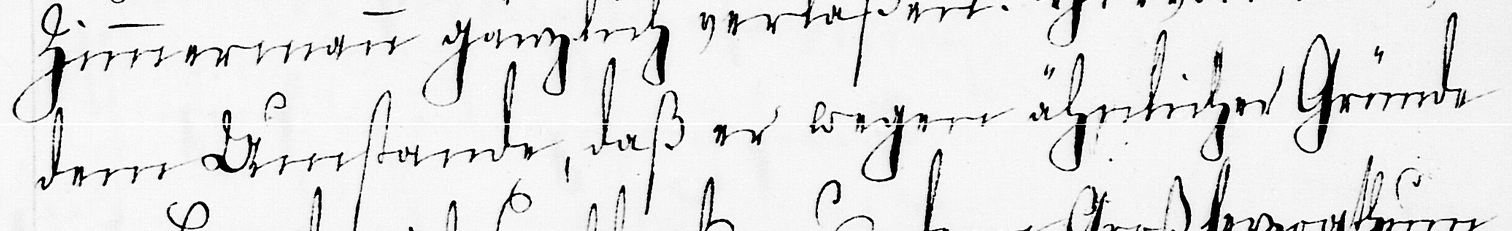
dem Umstande, daß er wegen ähnlicher Gründe
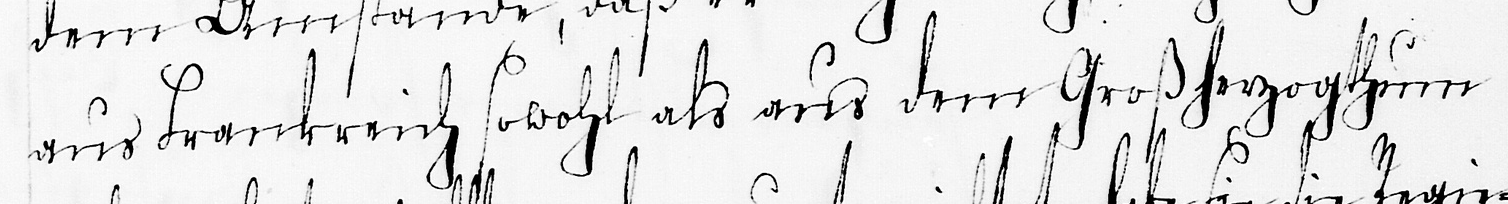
aus Frankreich sowohl als aus dem Großherzogthum
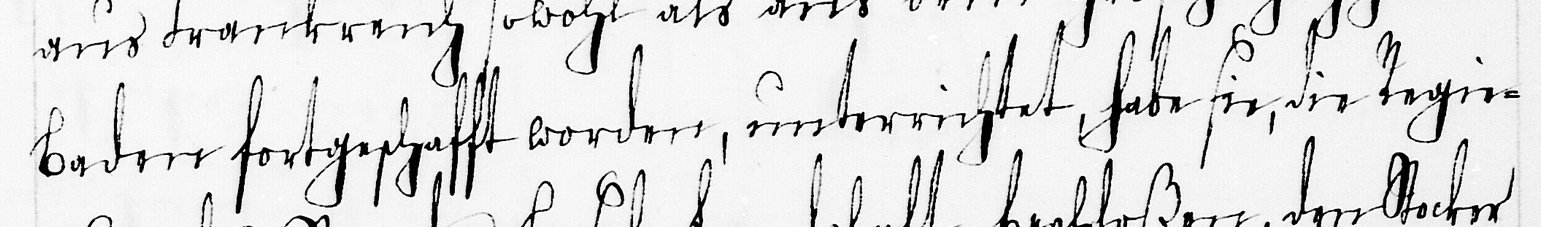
Baden fortgeschafft worden, unterrichtet, habe sie, die Regie¬
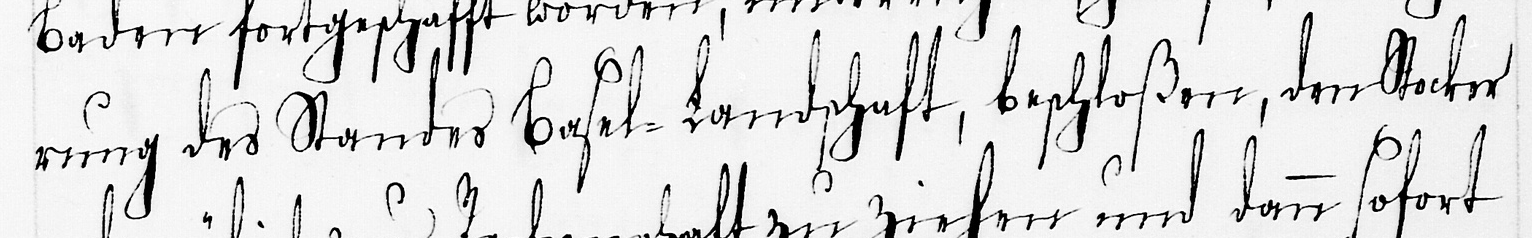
rung des Standes Basel-Landschaft, beschloßen, den Stocker
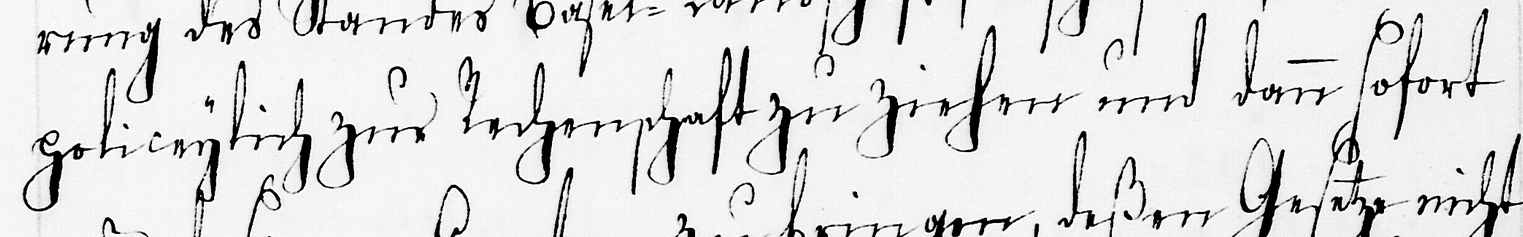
policeylich zur Rechenschaft zu ziehen und dann sofort
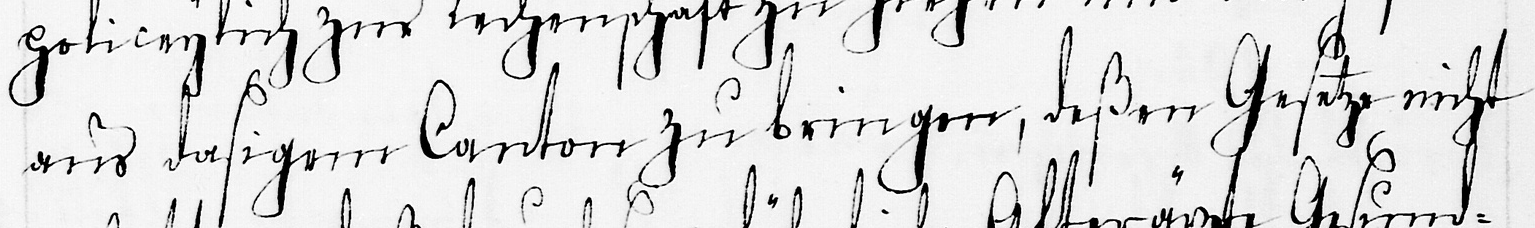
aus dasigem Canton zu bringen, deßen Gesetze nicht
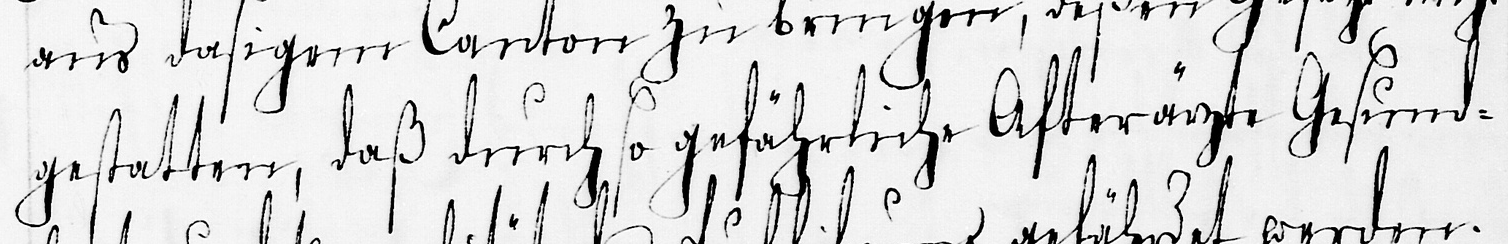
gestatten, daß durch so gefährliche Afterärzte Gesund¬
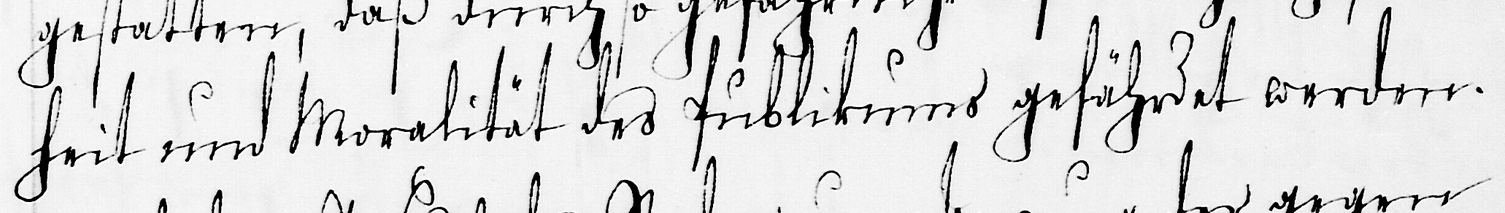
heit und Moralität des Publikums gefährdet werden.
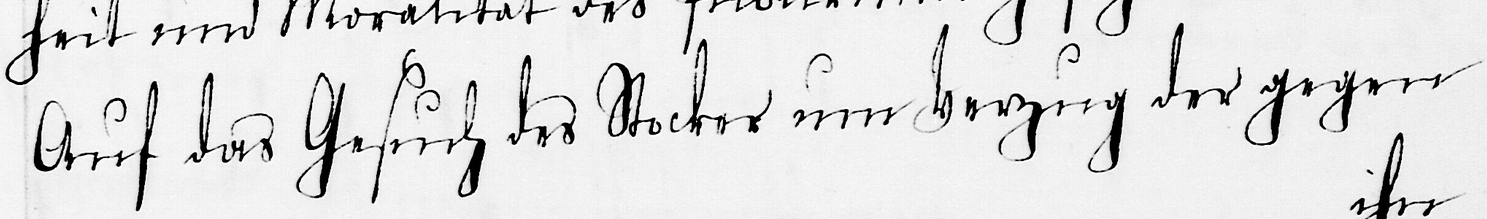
Auf das Gesuch des Stocker um Verzug der gegen
